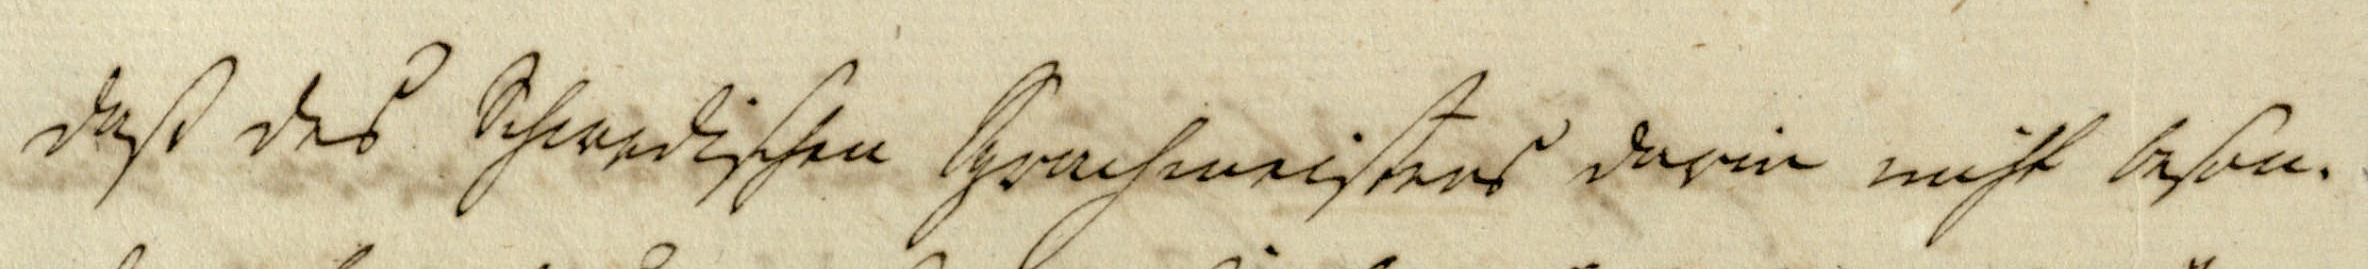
daß des Schwedischen Sprachmeisters darin nicht beson¬
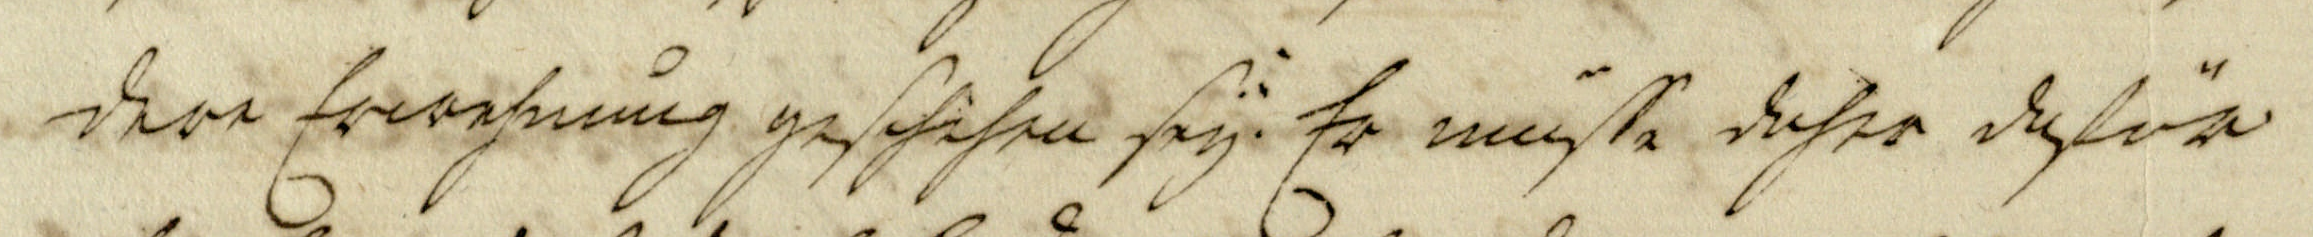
dere Erwehnung geschehen seÿ. Er müsse daher dafür
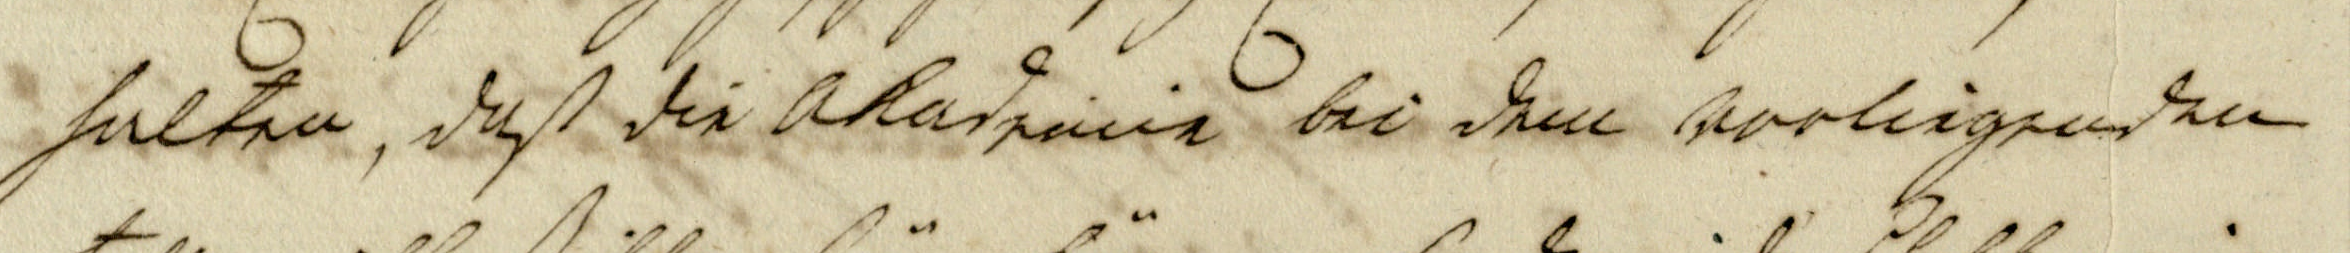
halten, daß die Akademie bei dem vorliegenden
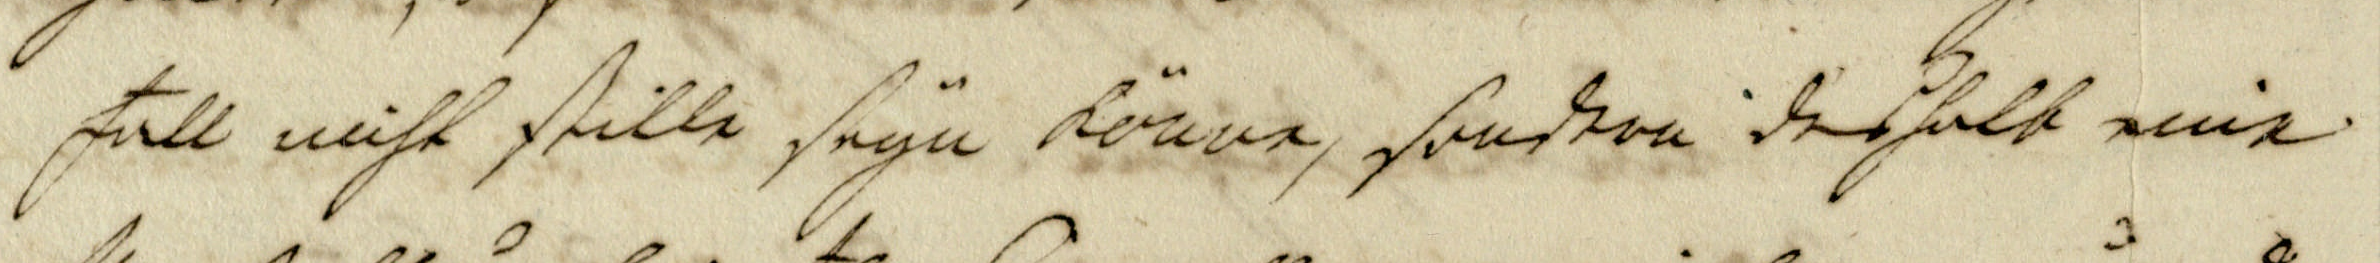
Fall nicht stille seÿn könne, sondern deshalb eine
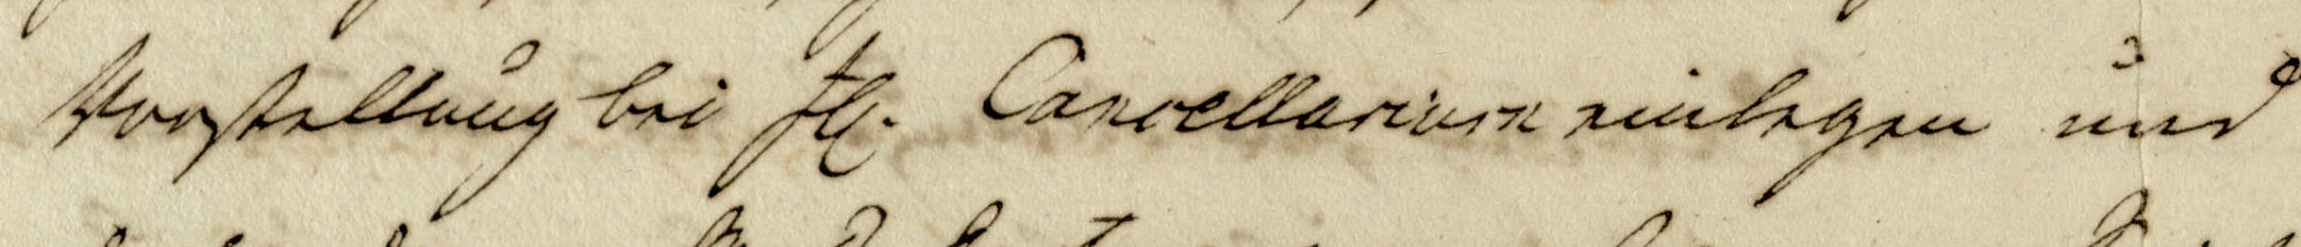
Vorstellung bei Ill. Cancellarium einlegen und
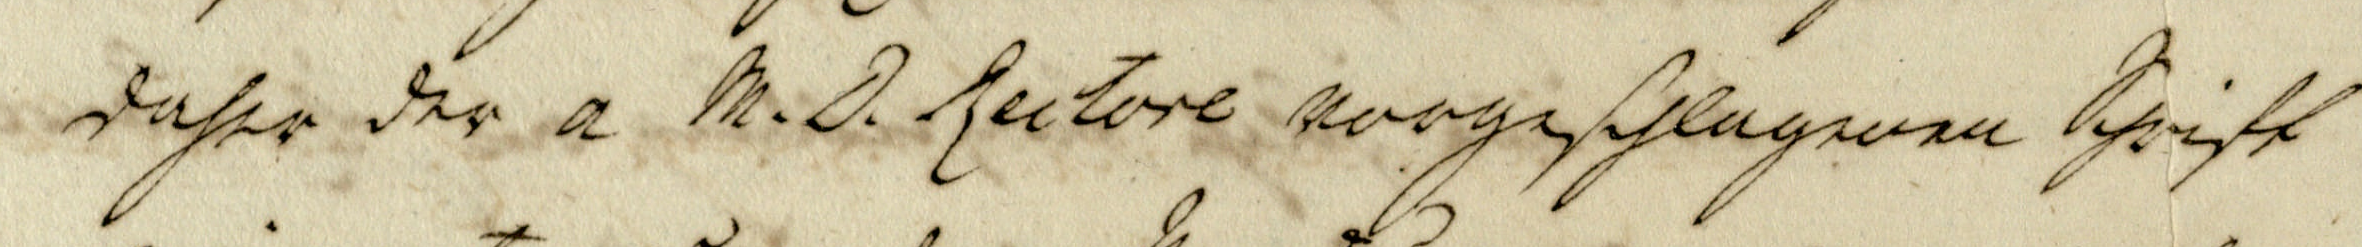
daher der a M. D. Rectore vorgeschlagenen Schrift
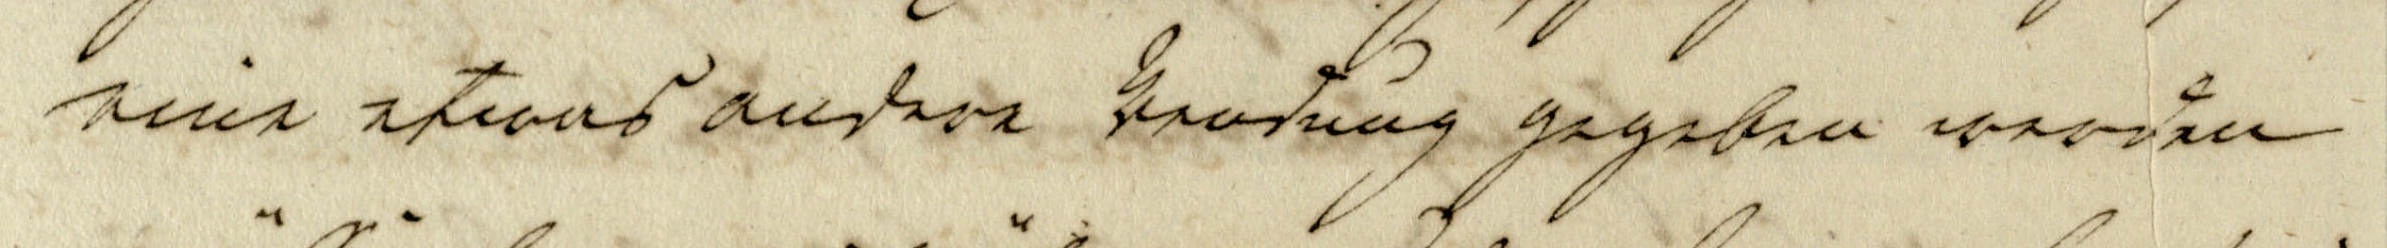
eine etwas andere Wendung gegeben werden
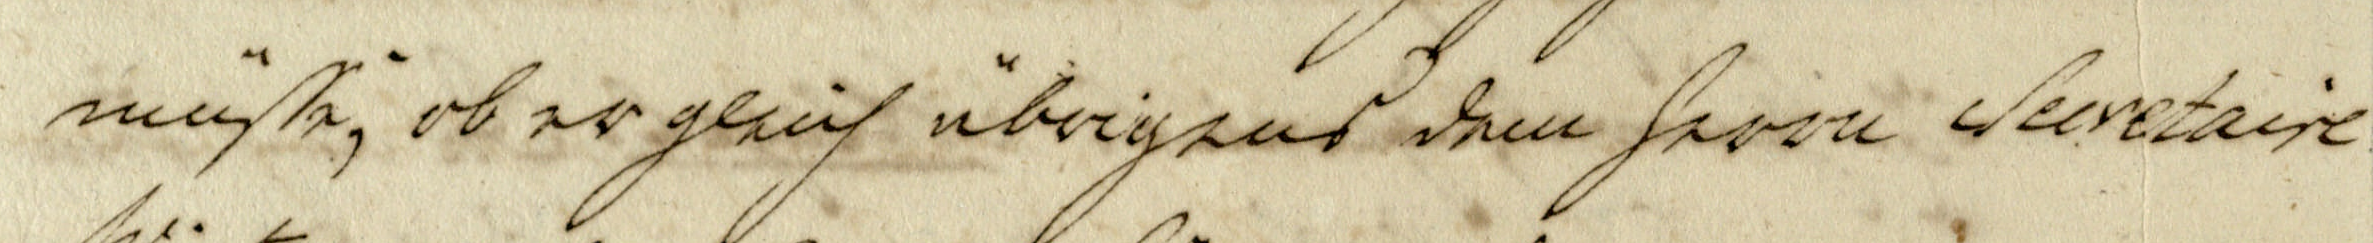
müsse, ob er gleich übrigens dem Herrn Secretaire
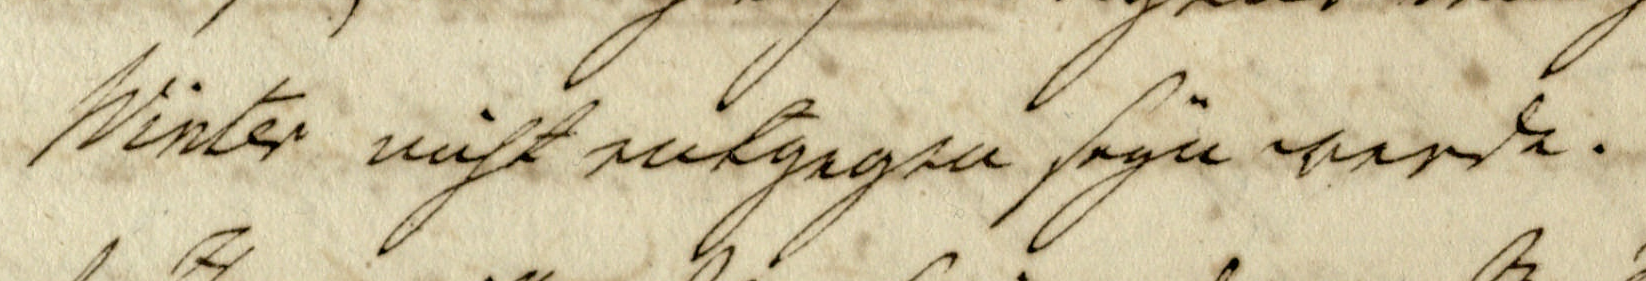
Winter nicht entgegen seÿn werde.
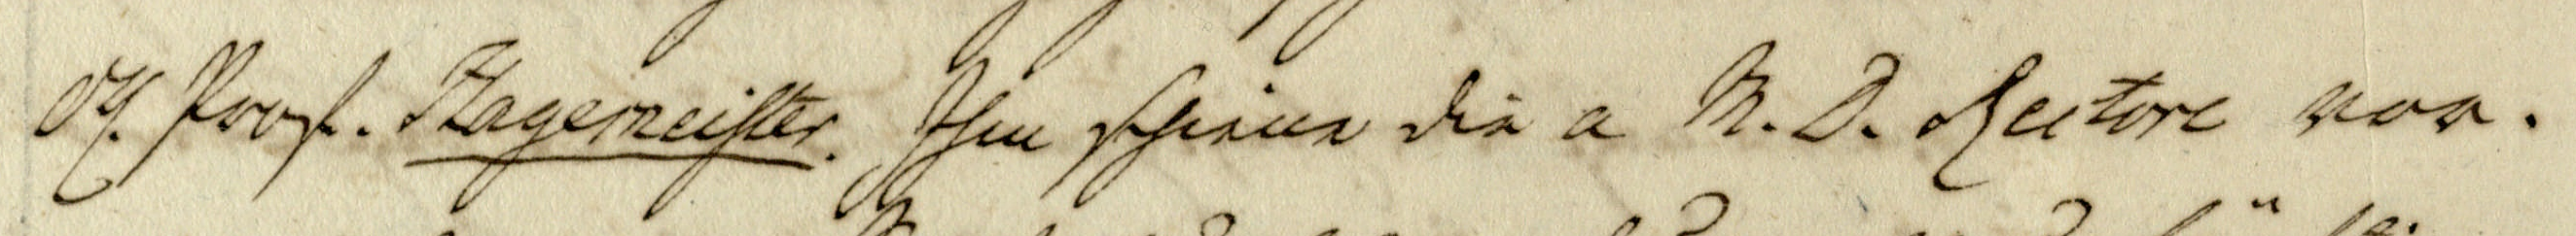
dh. Prof. Hagemeister. Ihm schiene die a M. D. Rectore vor¬
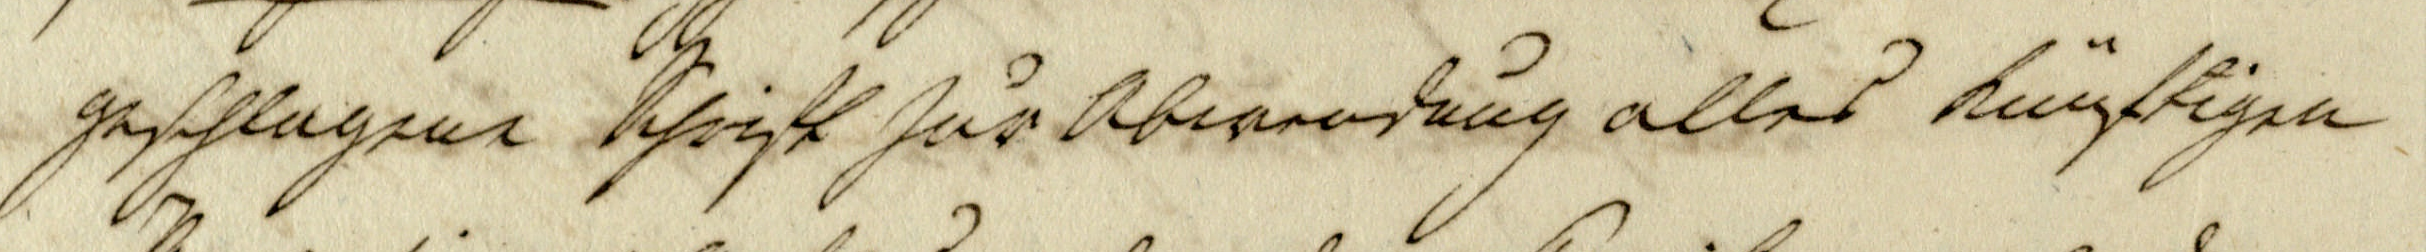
geschlagene Schrift zur Abwendung alles künftigen
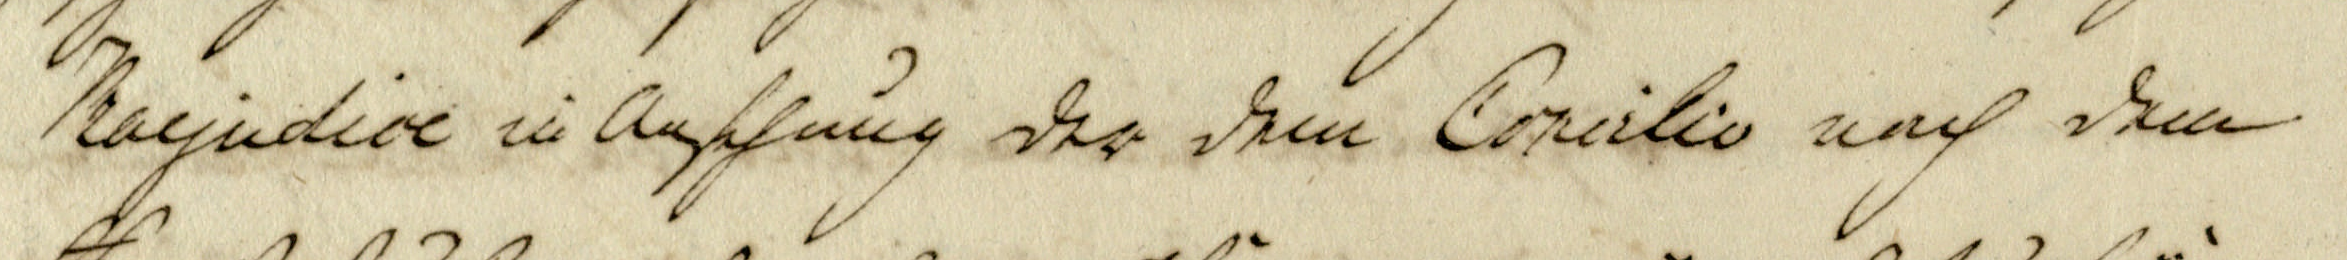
Praejudice in Ansehung der dem Concilio nach dem
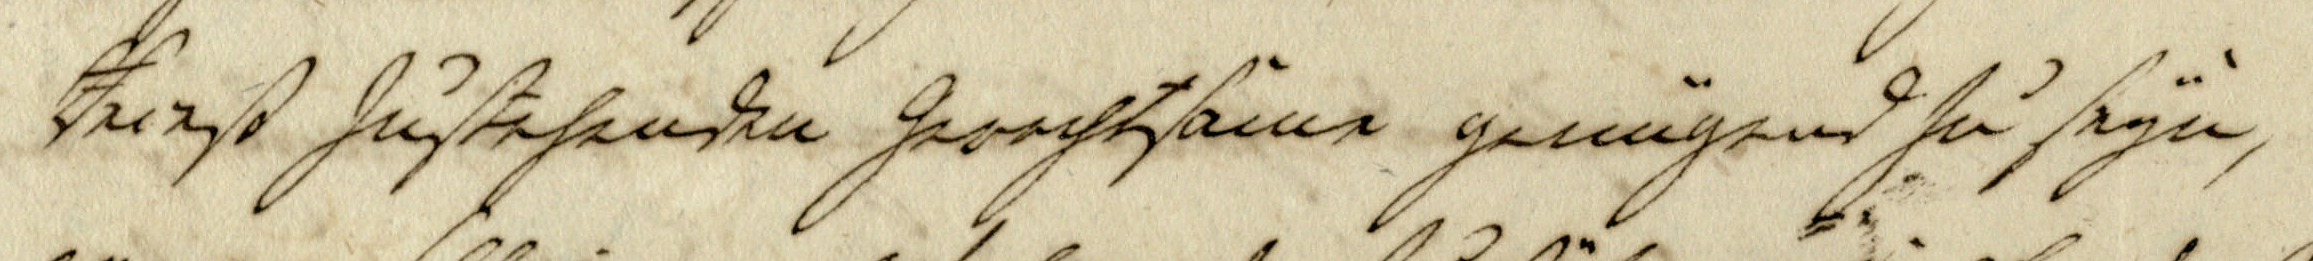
Receß zustehenden Gerechtsame genügend zu seÿn,
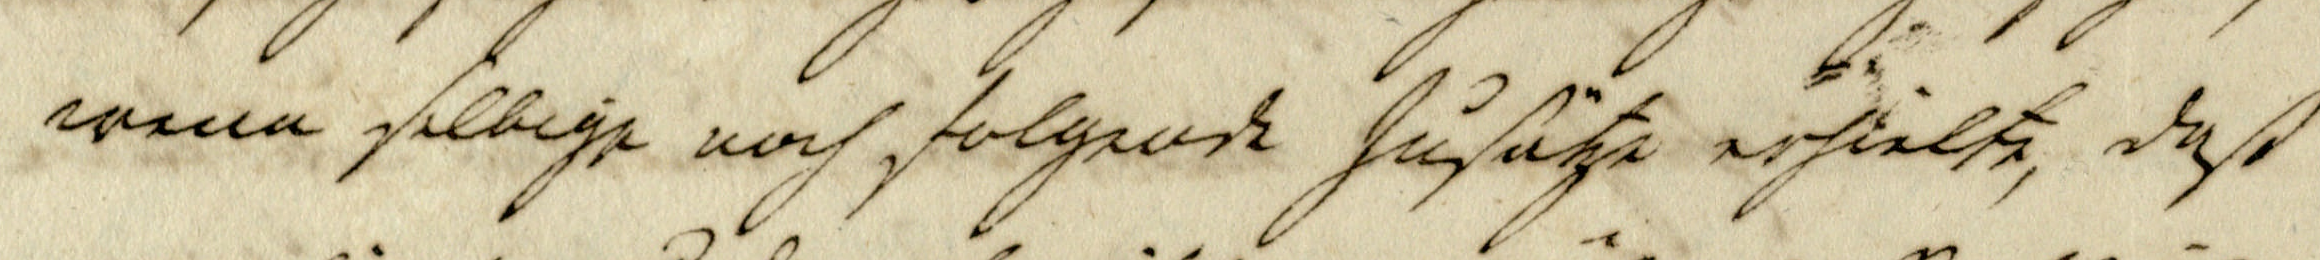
wenn selbige noch folgende Zusätze erhielte, daß
